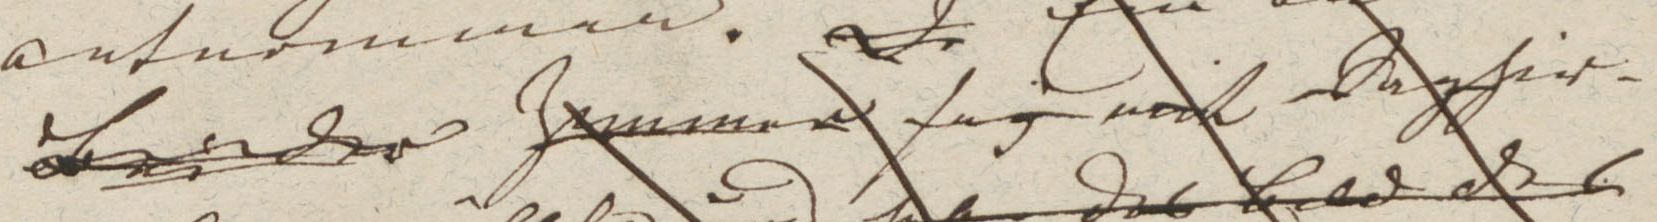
bei der Zimmer sey mit Saphir-
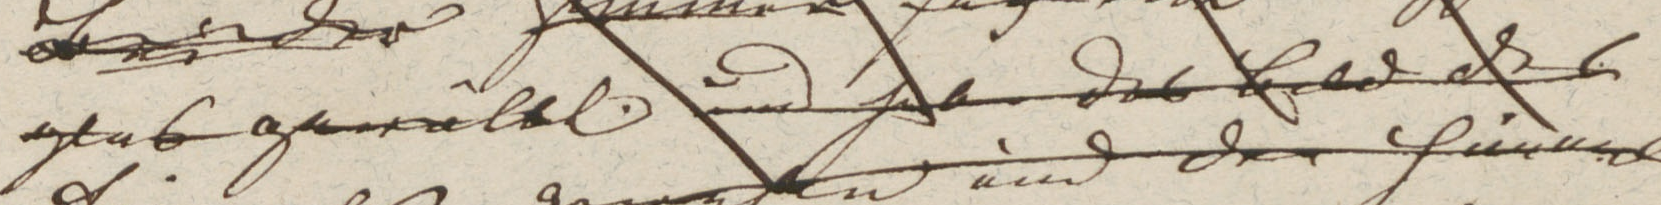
glas gewölbt und habe das Bild des
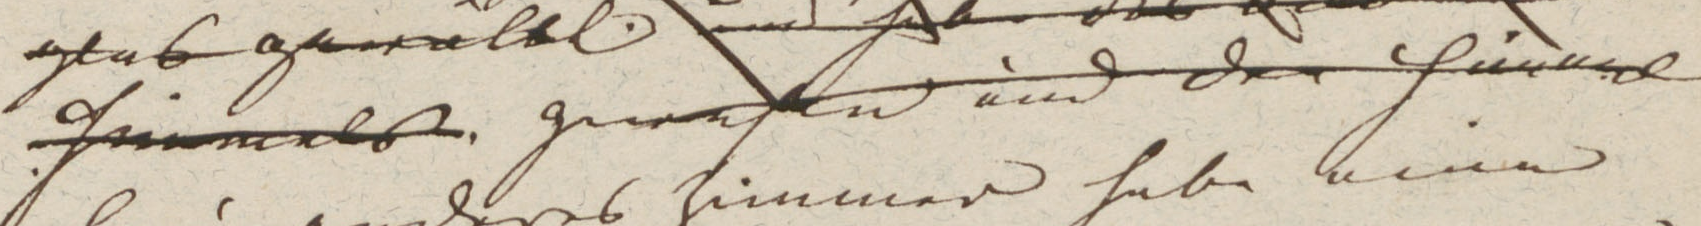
Himmels gewesen und den Himmel
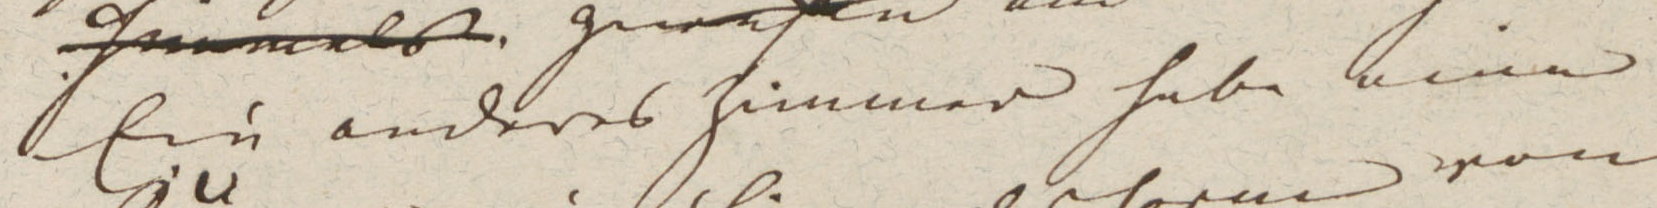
Ein anderes Zimmer habe eine
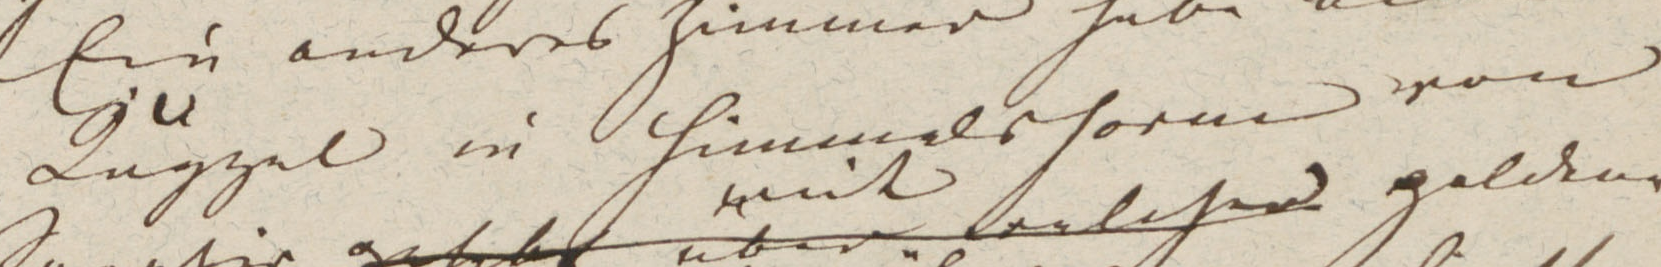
Kuppel in Himmelsform von
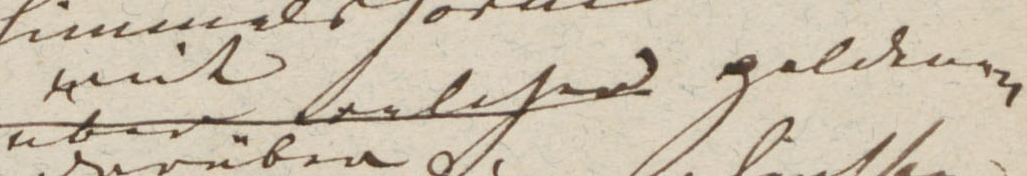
über welcher mit goldenen
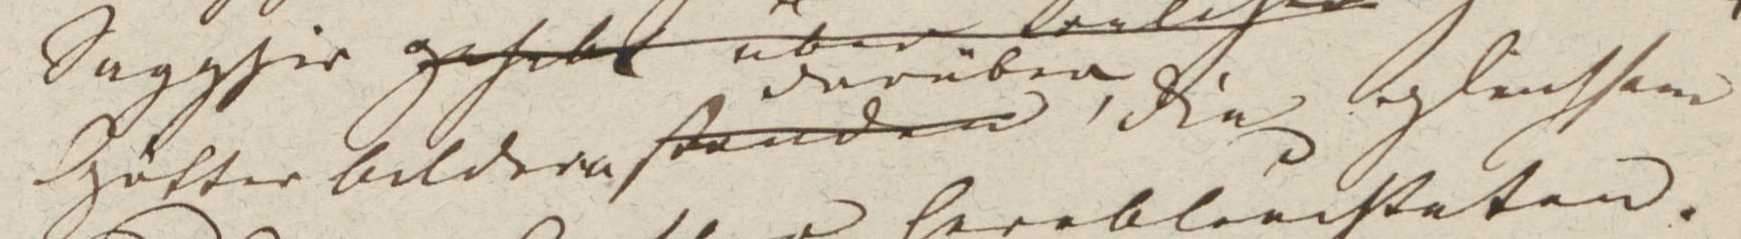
Götterbildern standen darüber, die gleichsam
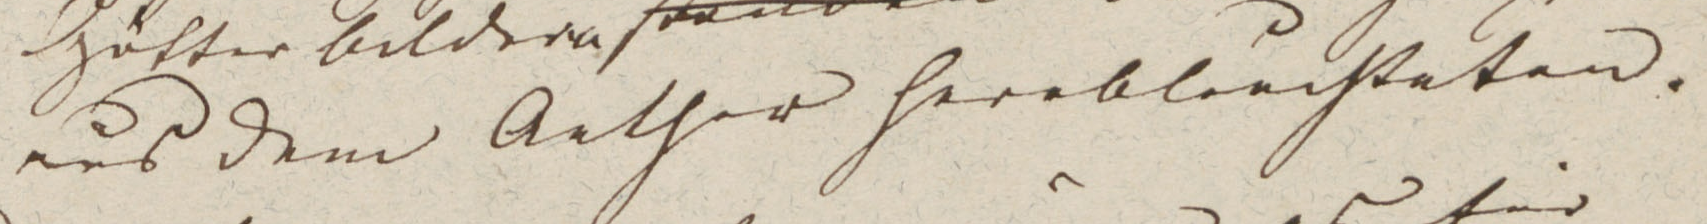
aus dem Aether herableuchteten.
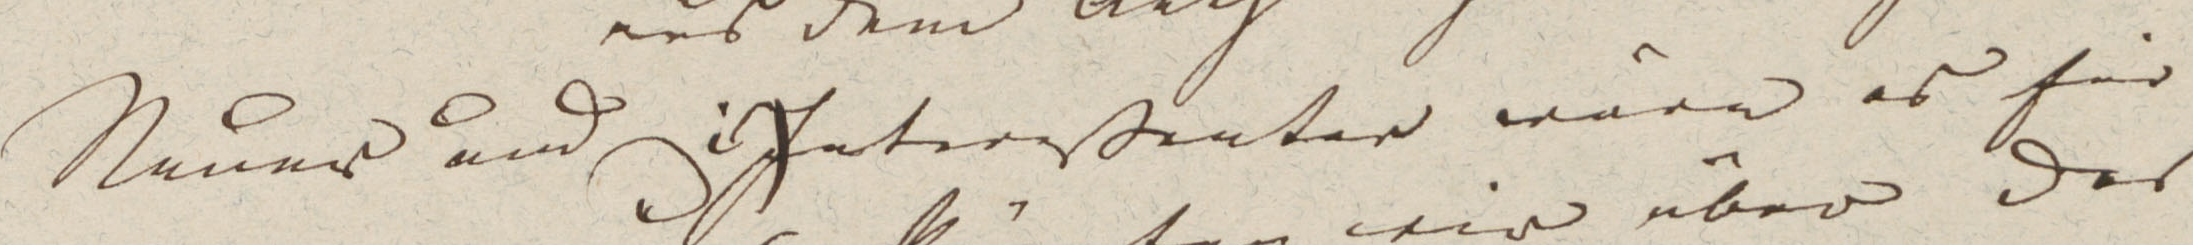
Neuer und Iinteressanter wäre es für
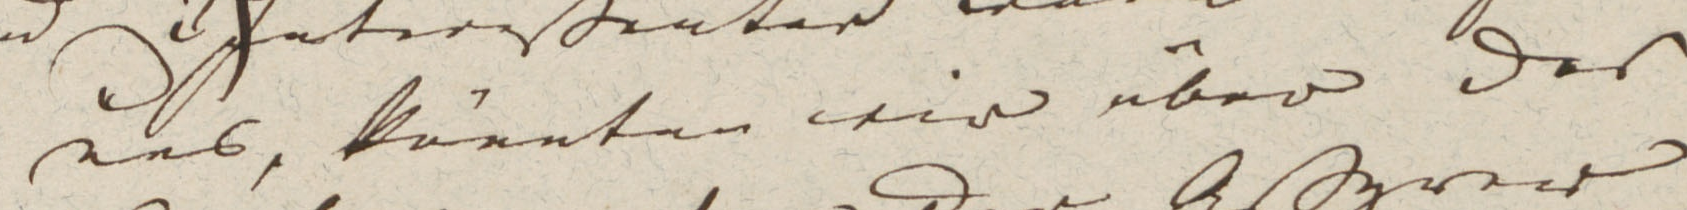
uns, könnten wir über das
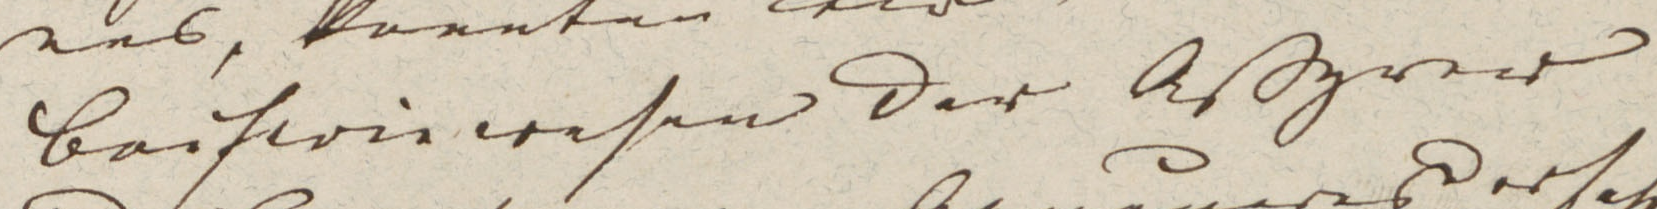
Boiseriewesen der Assyrer
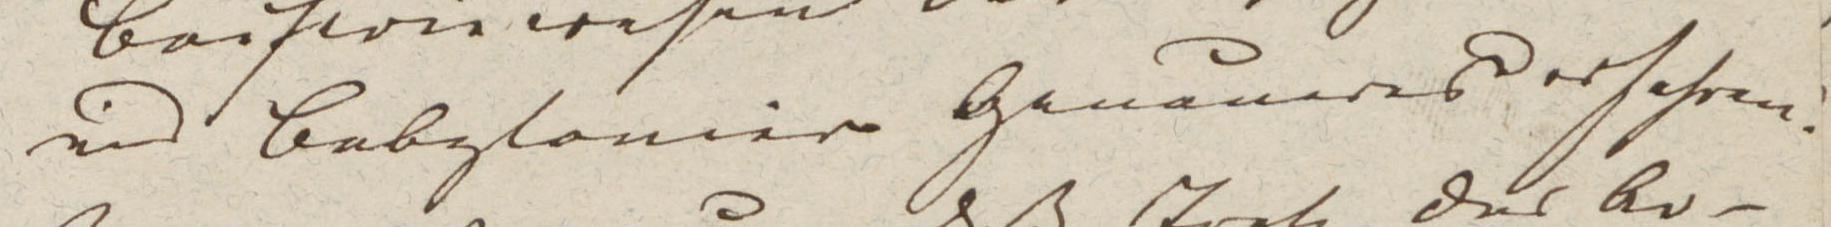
und Babylonier gGenaueres erfahren.
